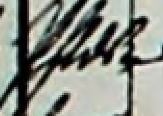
Pflds
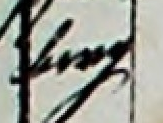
berg
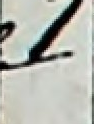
I
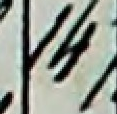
14
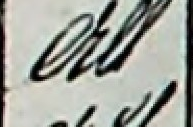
Alt
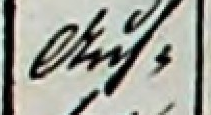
Aus„
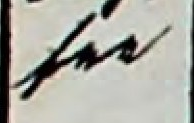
see
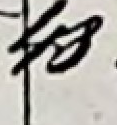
43
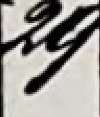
29
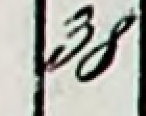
38
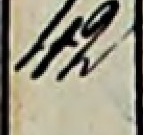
42
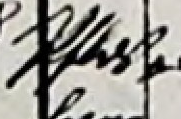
Pflds„
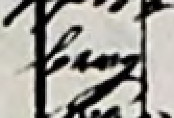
berg
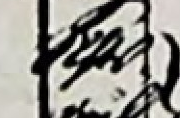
Stifts
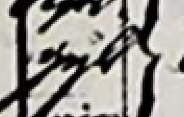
gütt
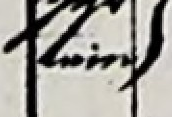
lein
